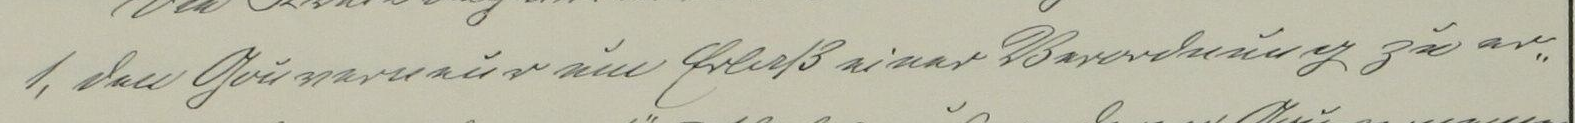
1. den Gouverneur um Erlaß einer Verordnung zu er-
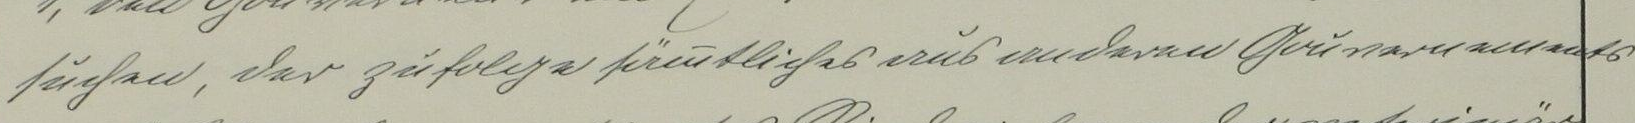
suchen, der zufolge sämmtliches aus anderen Gouvernements
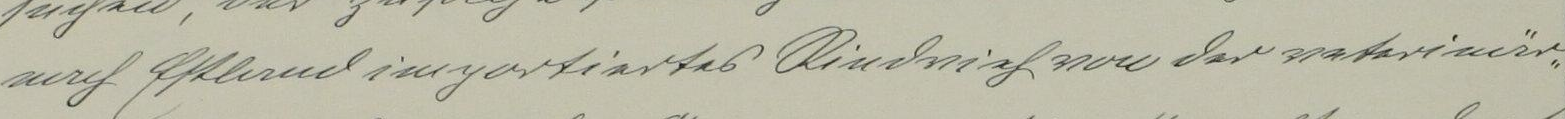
nach Estland importiertes Rindvieh von der veterinär-
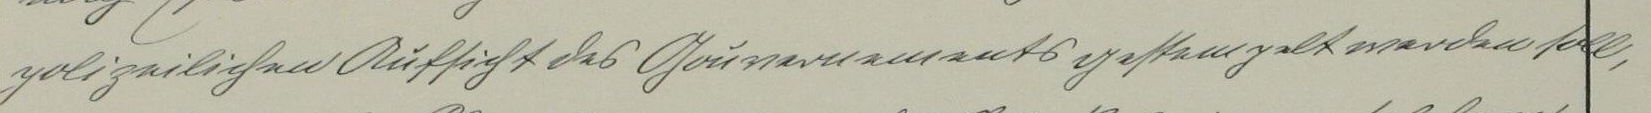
polizeilichen Aufsicht des Gouvernements gestempelt werden soll,
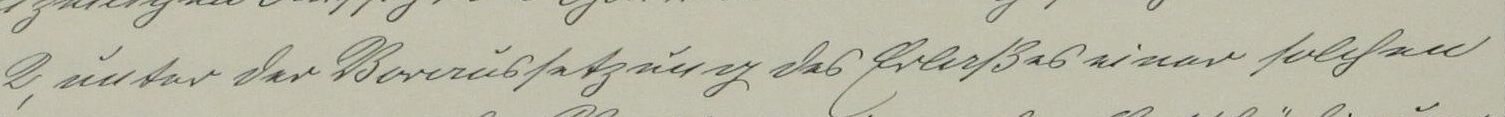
2. unter der Voraussetzung des Erlaßes einer solchen
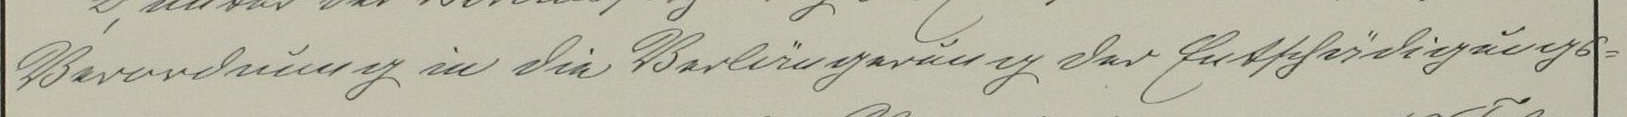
Verordnung in die Verlängerung der Entschädigungs-
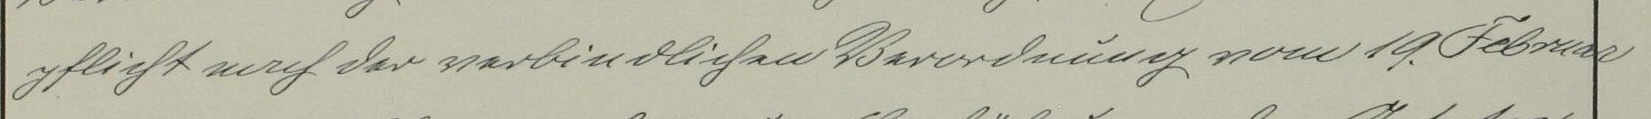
pflicht nach der verbindlichen Verordnung vom 19. Februar
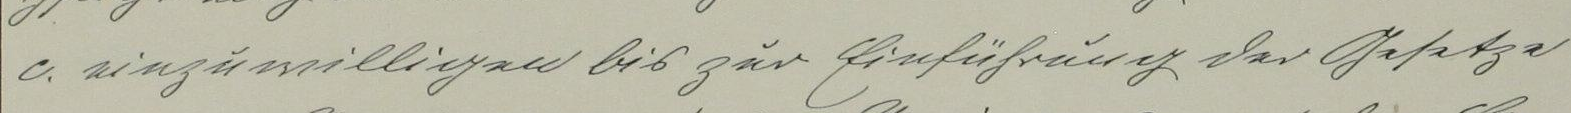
c. einzuwilligen bis zur Einführung der Gesetze
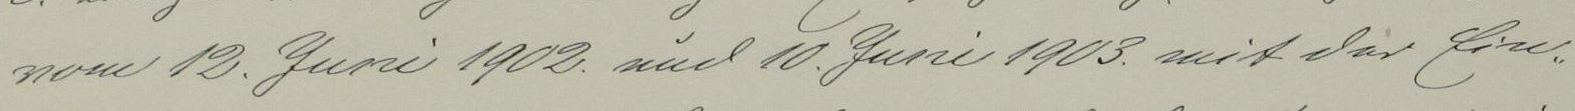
vom 12. Juni 1902. und 10. Juni 1903. mit der Ein-
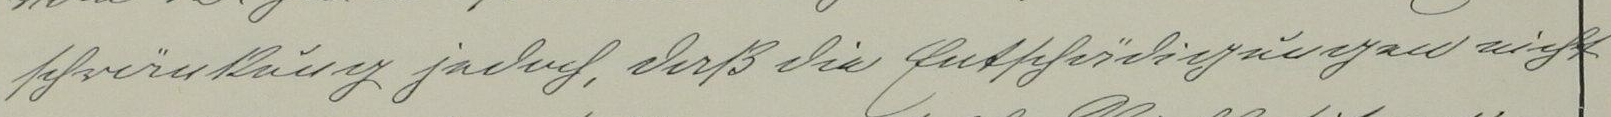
schränkung jedoch, daß die Entschädigungen nicht
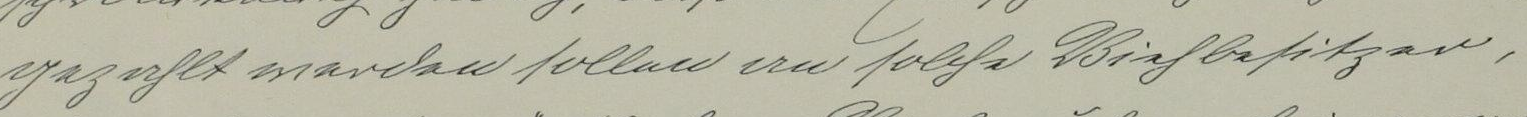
gezahlt werden sollen an solche Viehbesitzer,
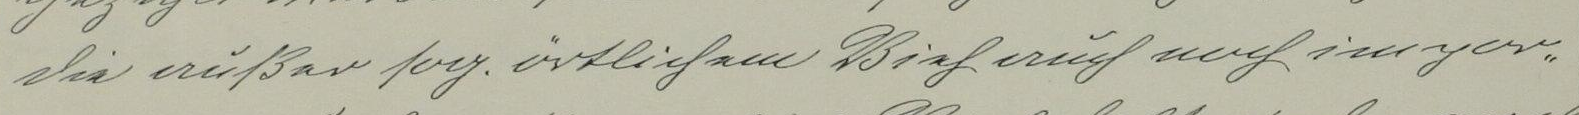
die außer sog. örtlichem Vieh auch noch impor-
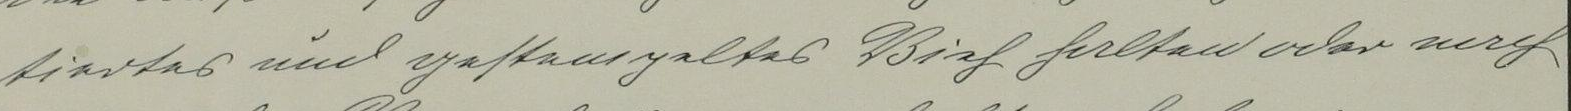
tiertes und gestempeltes Vieh halten oder nach
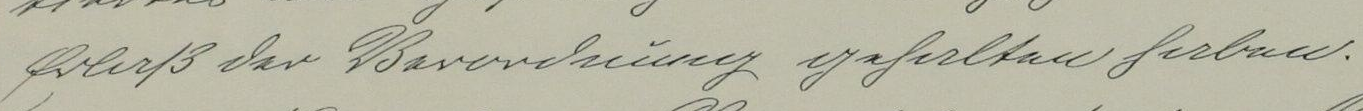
Erlaß der Verordnung gehalten haben.
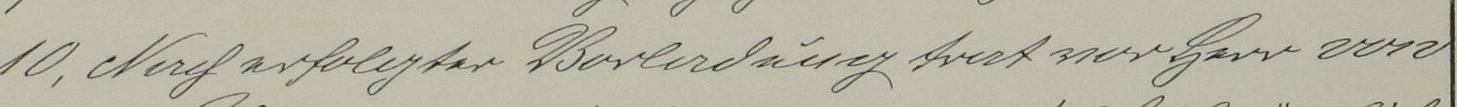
10. Nach erfolgter Vorladung trat vor Herr von
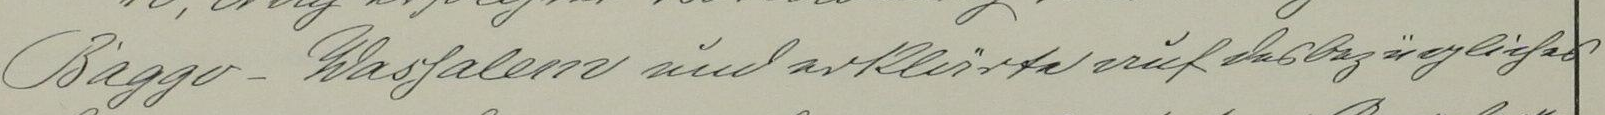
Baggo-Wassalem und erklärte auf desbezügliches
